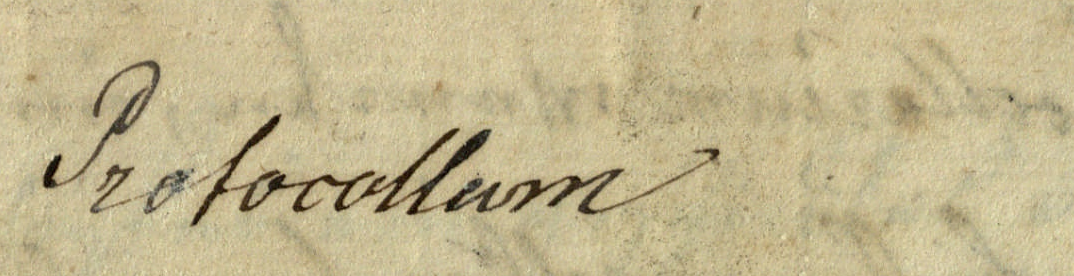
Protocollum
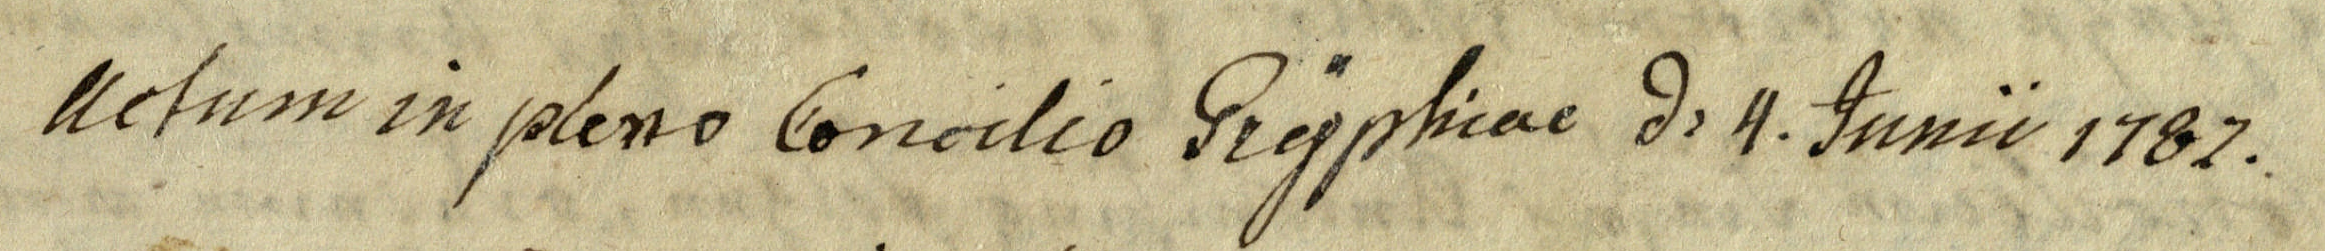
Actum in pleno Concilio Grÿphicae d: 4. Junii 1782.
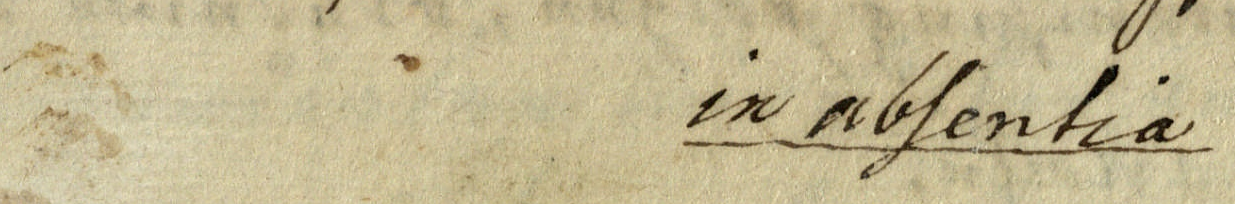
in absentia
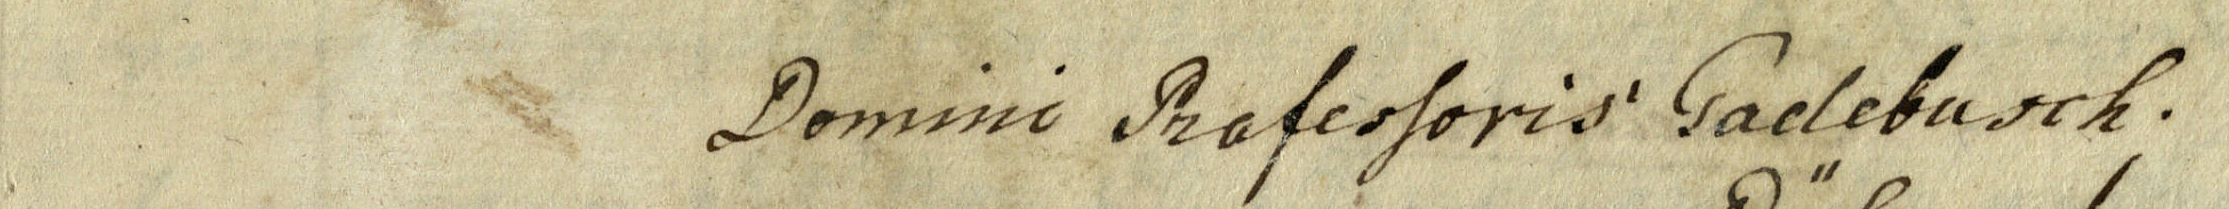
Domini Professoris Gadebusch.
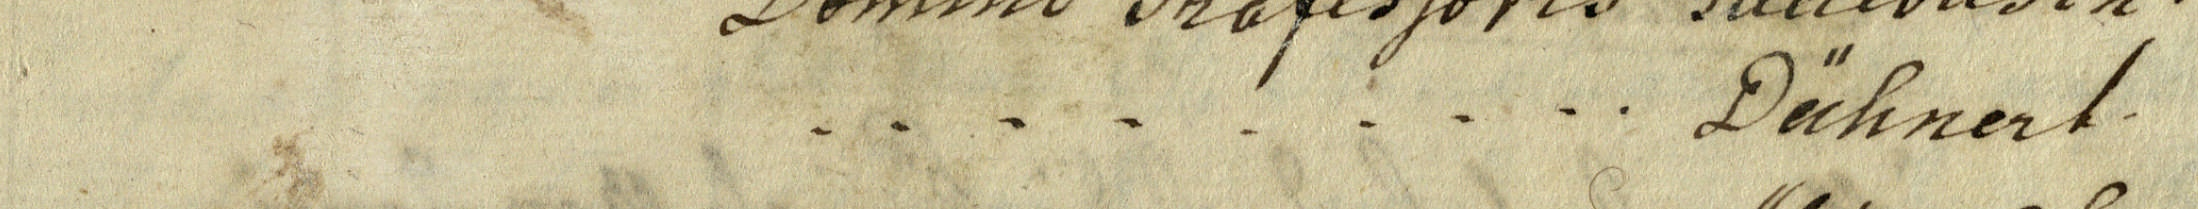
Dähnert
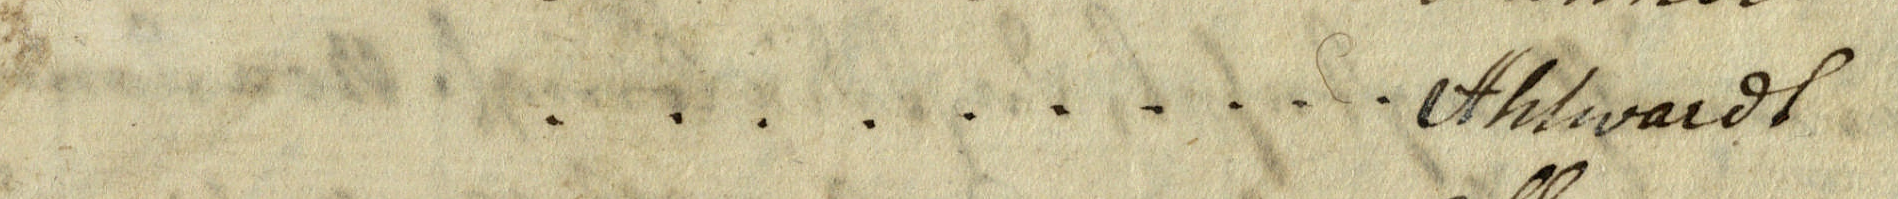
Ahlwardt
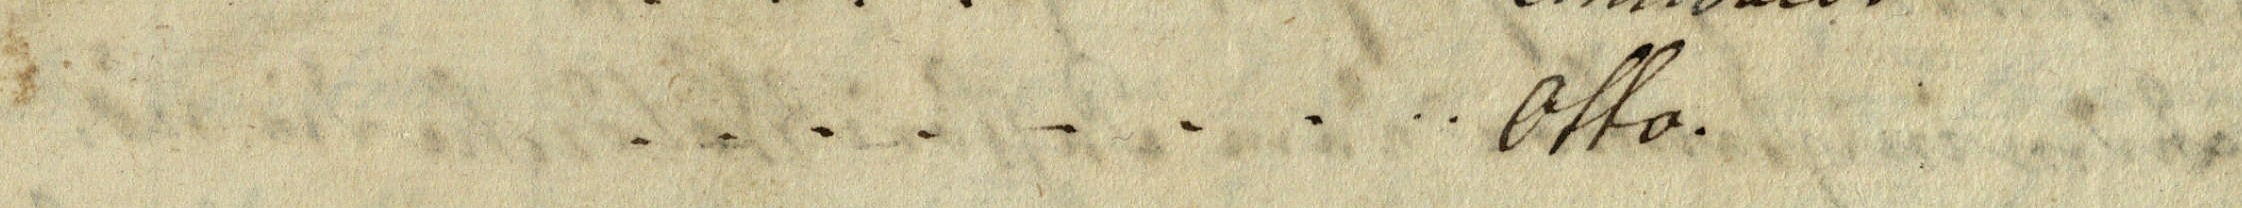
Otto.
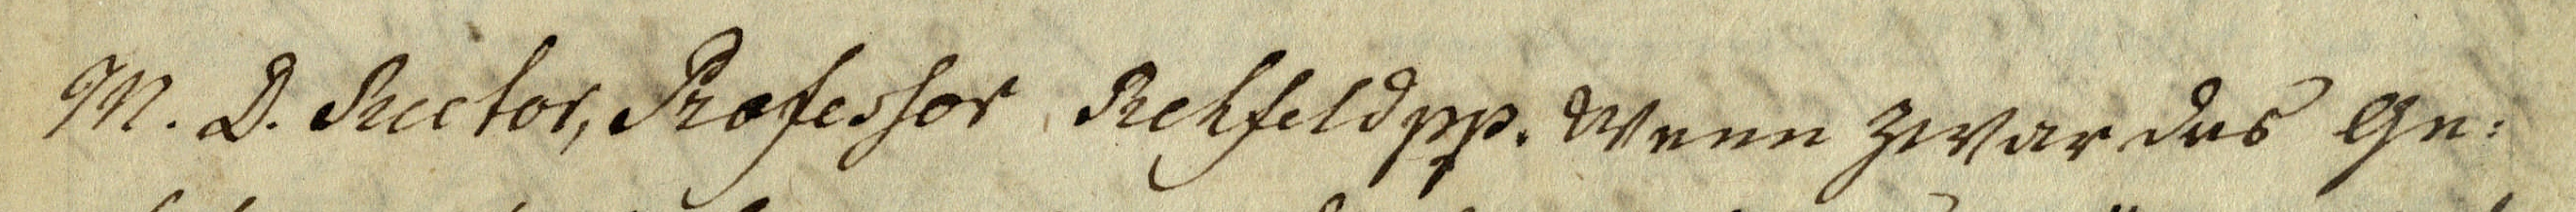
1. M. D. Rector, Professor Rehfeld pp. Wenn zwar das Ge¬
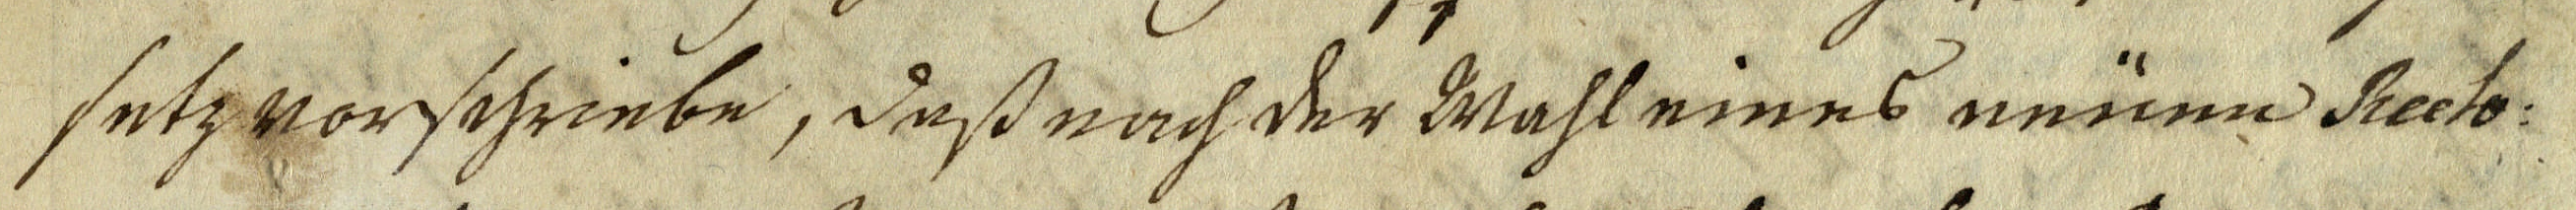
setz vorschriebe, daß nach der Wahl eines neüen Recto¬
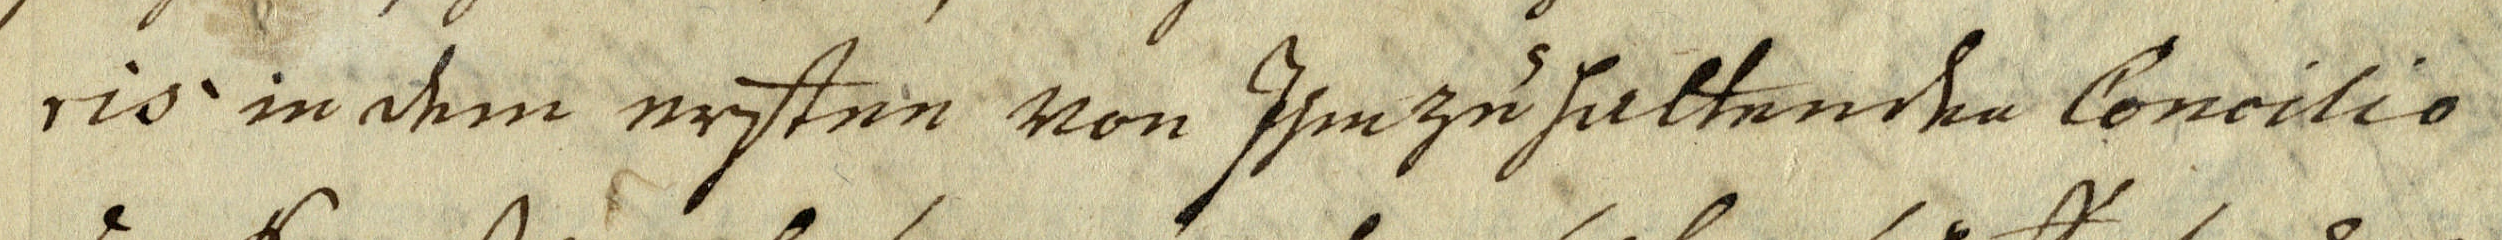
ris in dem ersten von Ihm zu haltenden Concilio
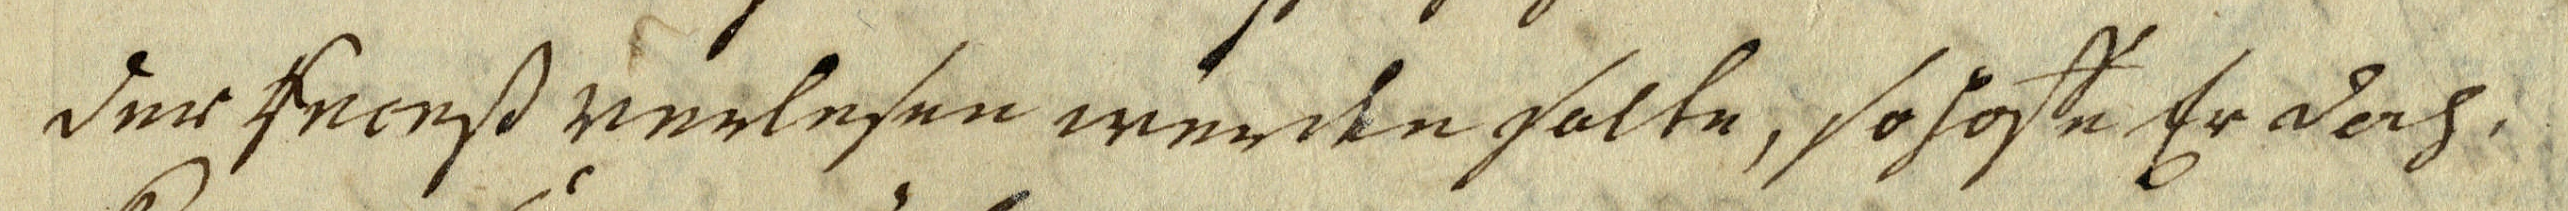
der Receß verlesen werden solte, so hoffe Er doch,
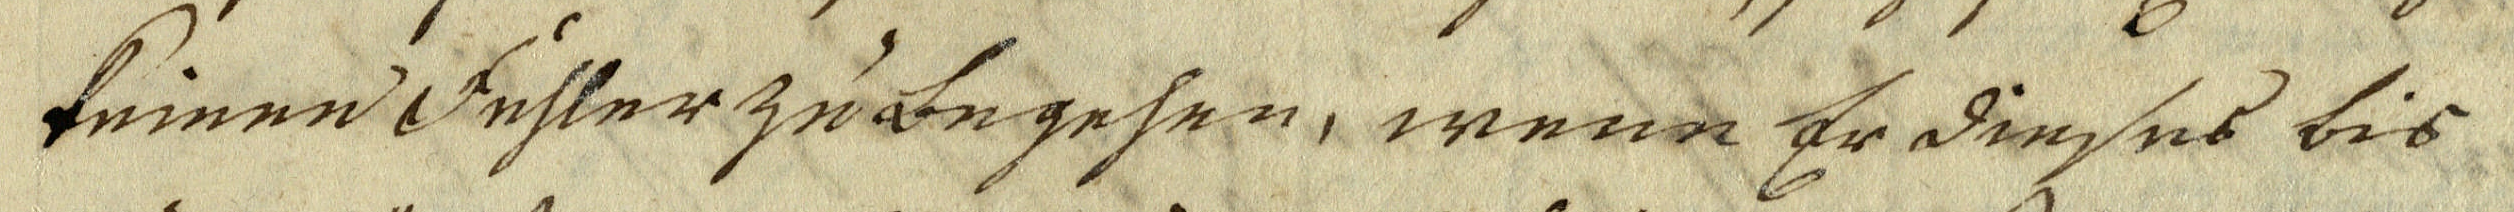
keinen Fehler zu begehen, wenn Er dieses bis
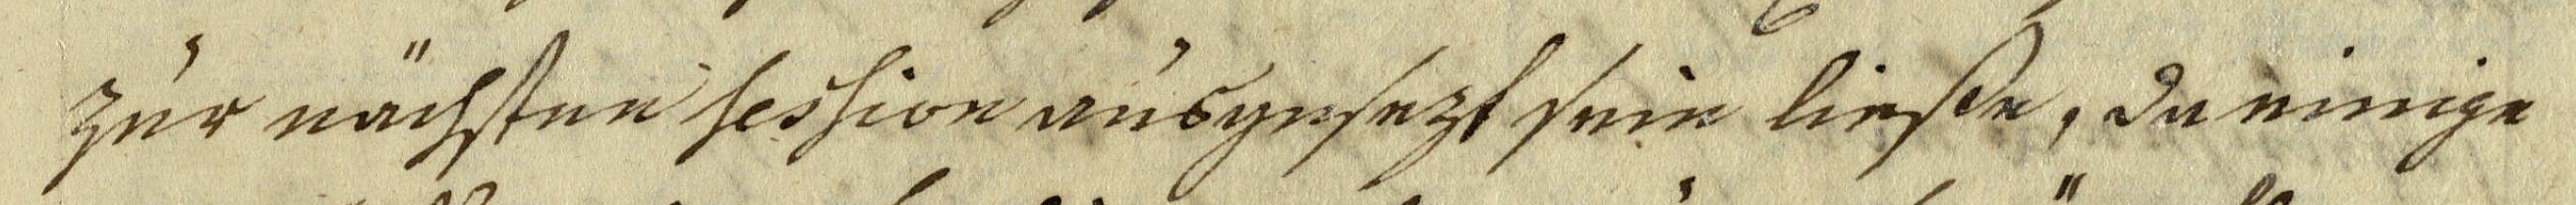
zur nächsten session ausgesetzt sein ließe, da einige
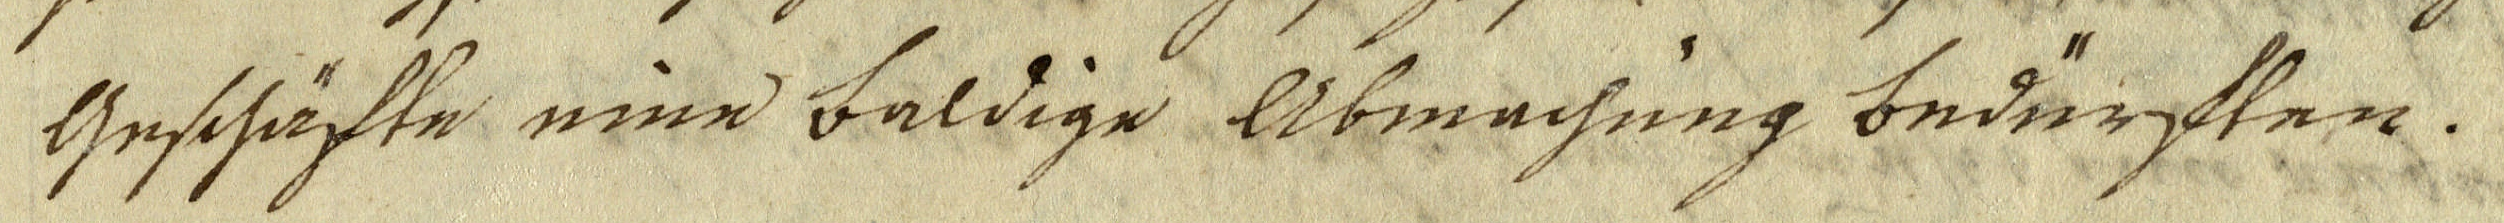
Geschäfte eine baldige Abmachung bedürften.
